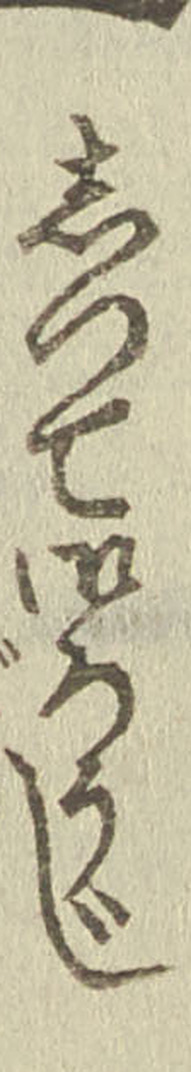しつて御ろうじ
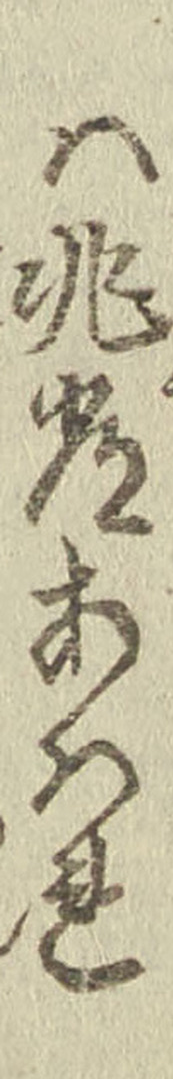は非常あはれ
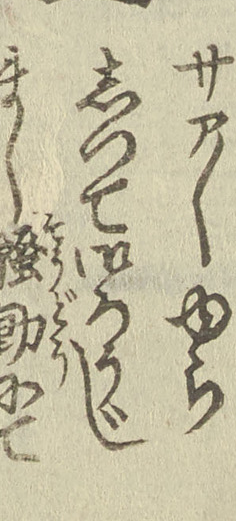しつて御ろうじ
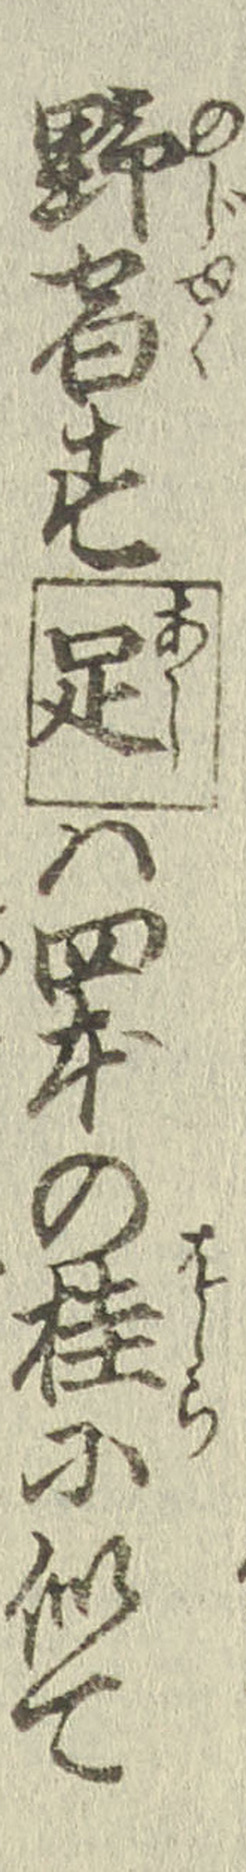野宿す「足」は四本の柱に似て
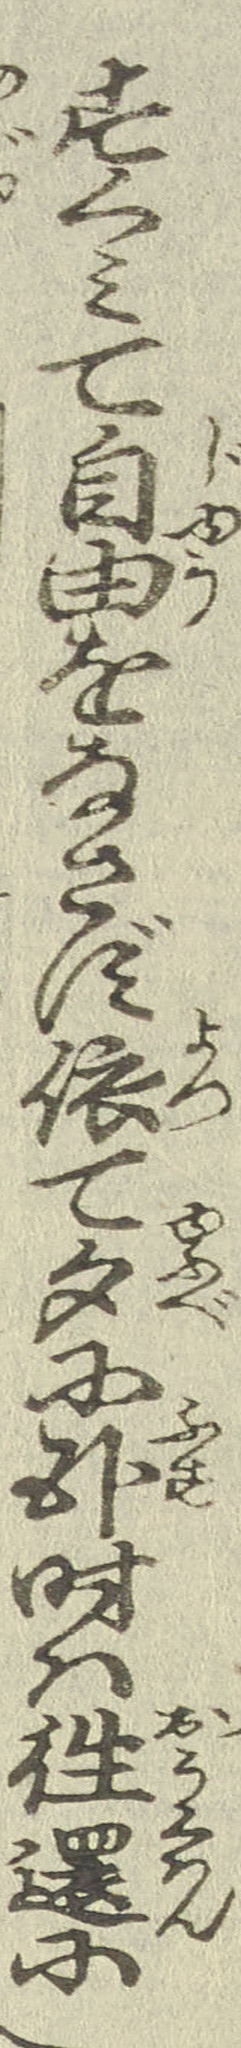すくみて自由をなさず依て夕に臥時は往還に
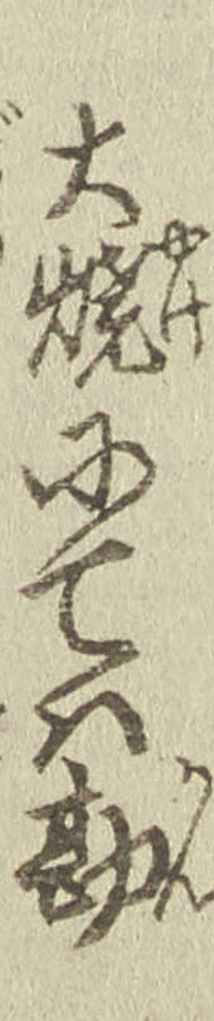大焼にては勘
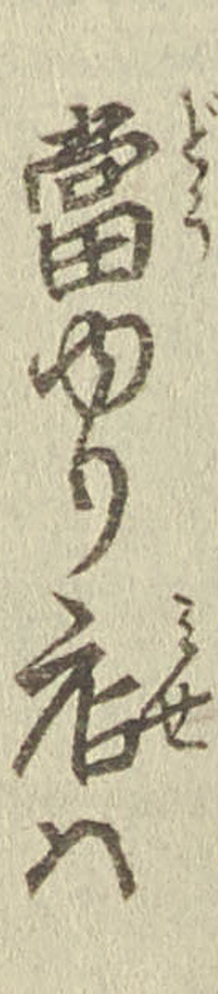當ゆり店は
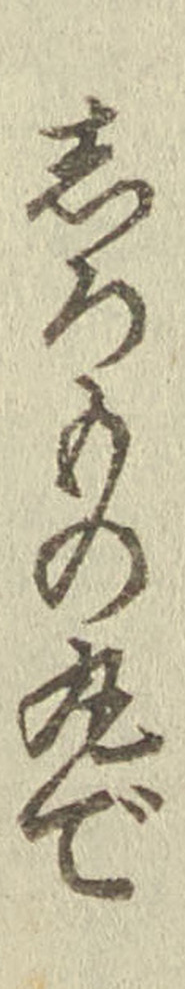しろもの丸で
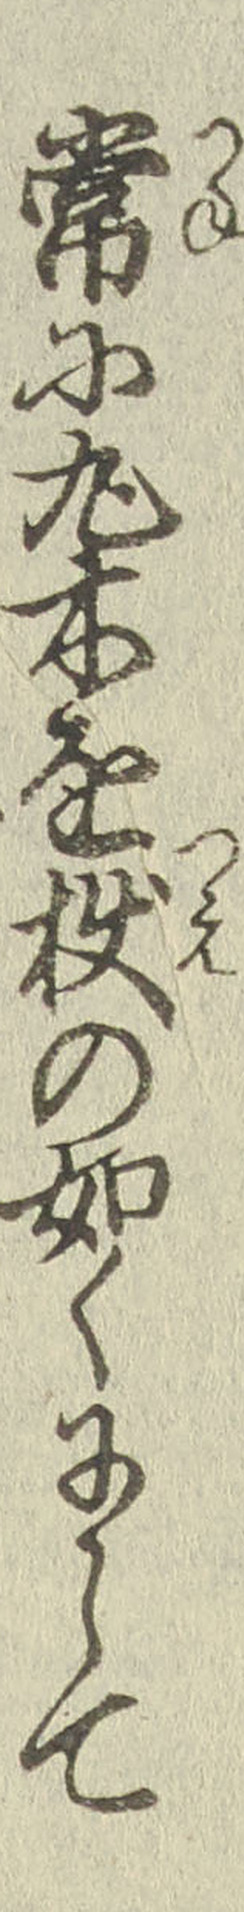常に丸木を杖の如くにして
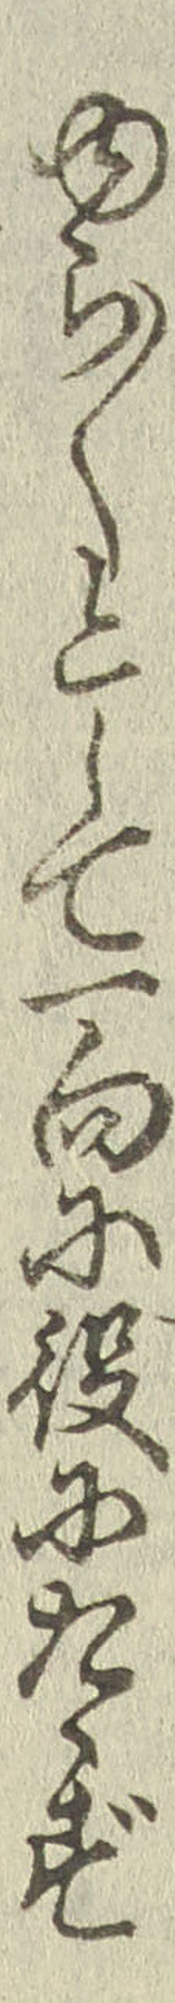ゆら〳〵として一向に役にたゝず
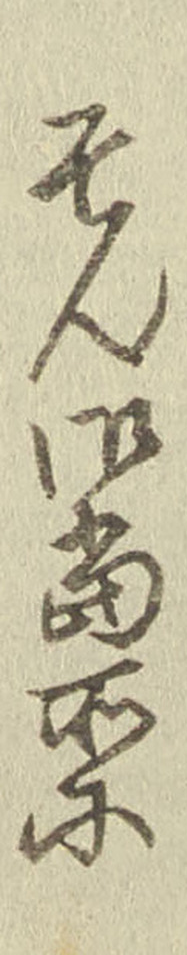そん御當所に
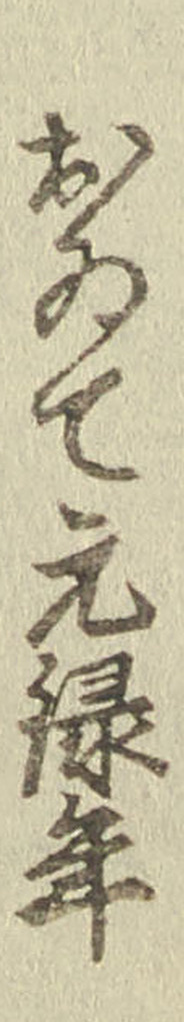おゐて元禄年
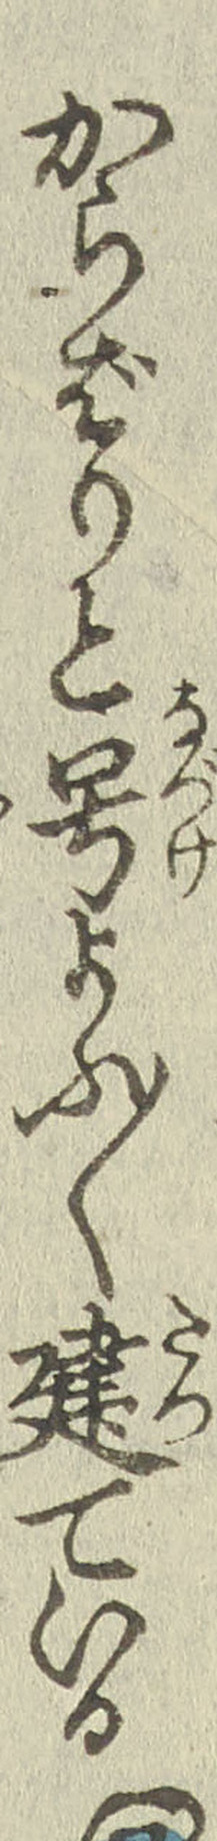からばりと号よふ〳〵建ている
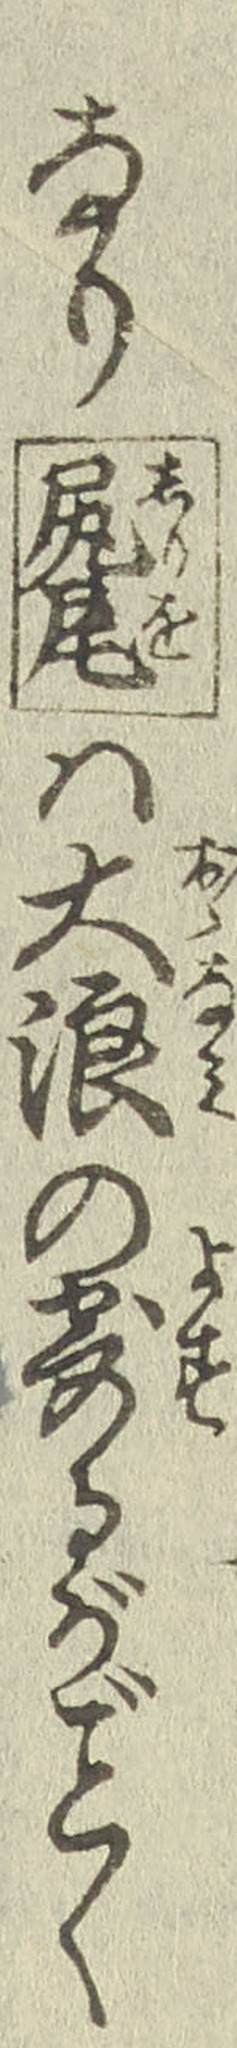なり「尻尾」は大浪の寄るがごとく
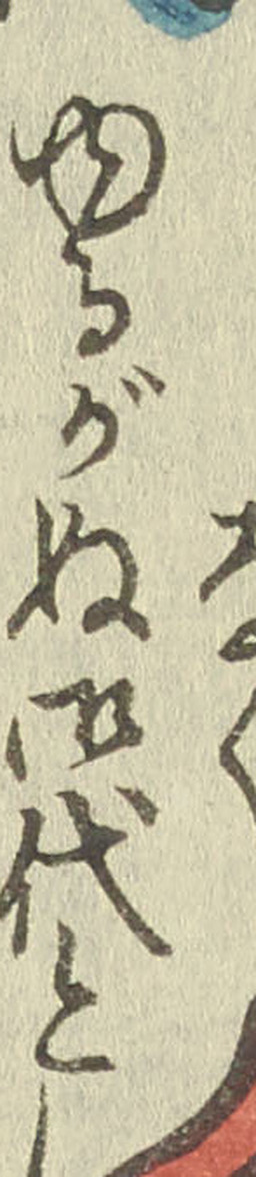ゆるがぬ御代と
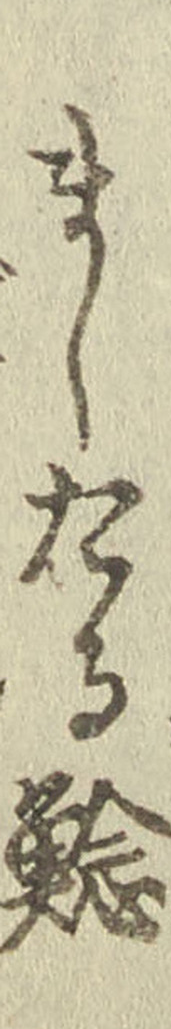ましたる鯰
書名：上方震下り瓢磐鯰の化物 一名難獣といふ
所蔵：東京大学総合図書館 General Library in the University of Tokyo, JAPAN
